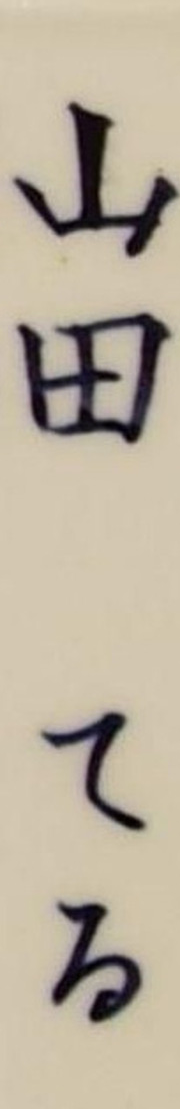山田てる
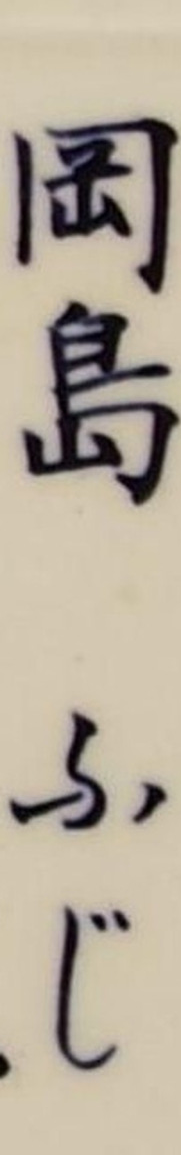岡島ふじ
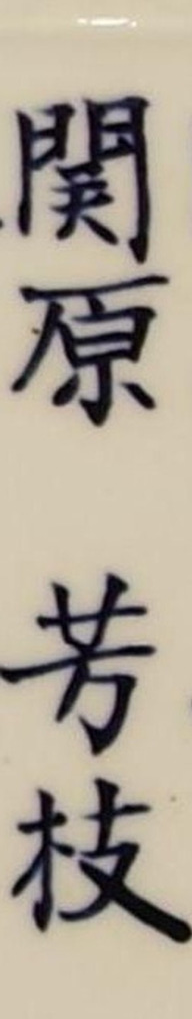関原芳枝
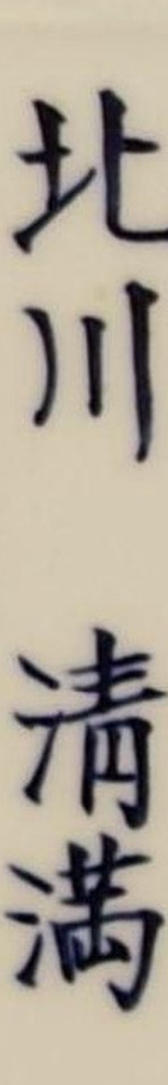北川清満
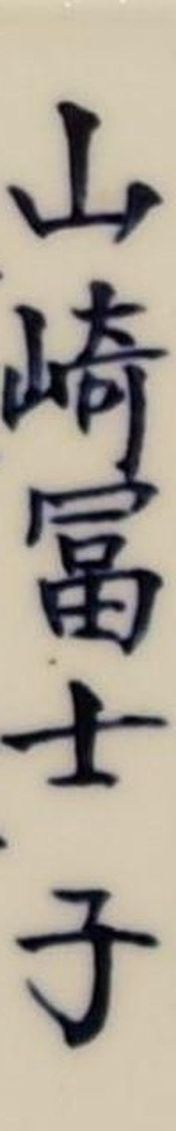山崎冨士子
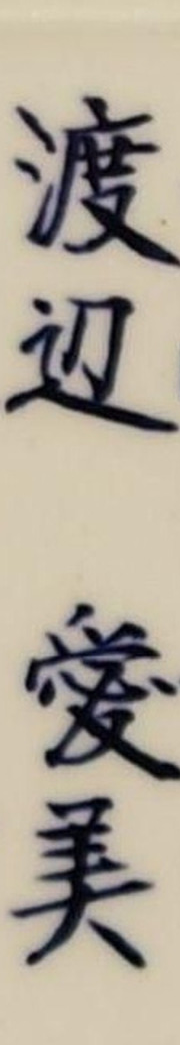渡辺愛美
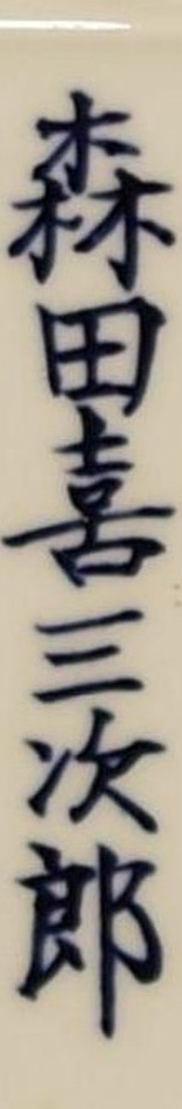森田喜三次郎
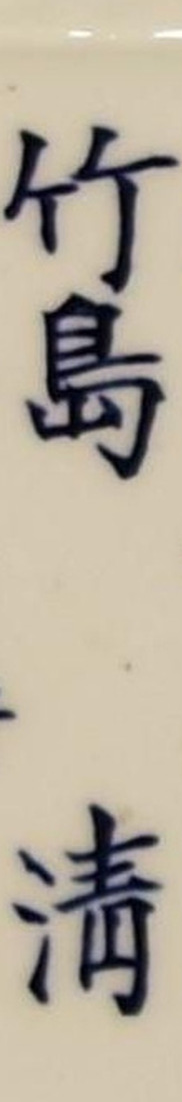竹島清
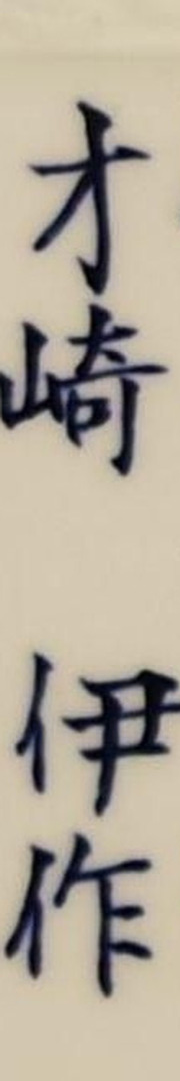才崎伊作
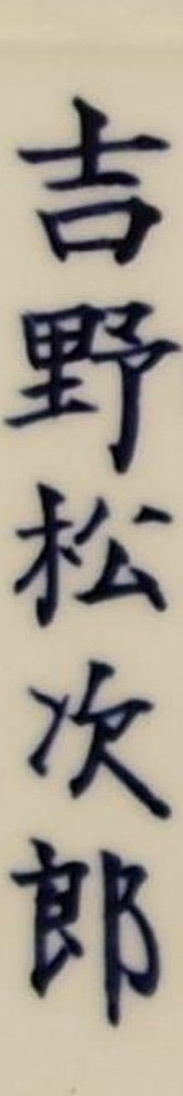吉野松次郎
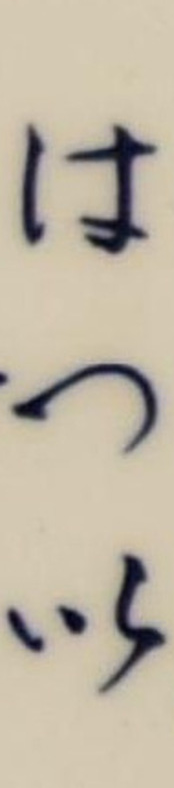はつい
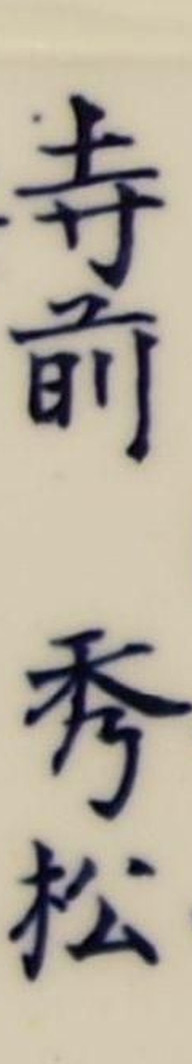寺前秀松
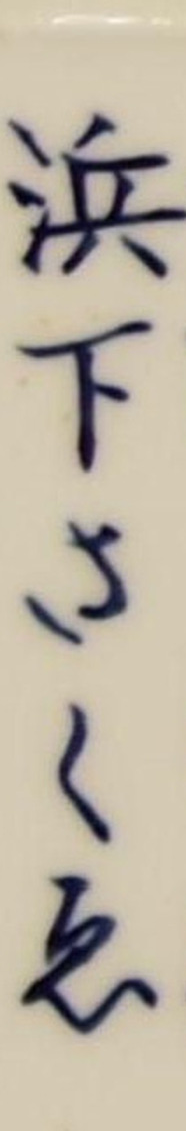浜下さくゑ
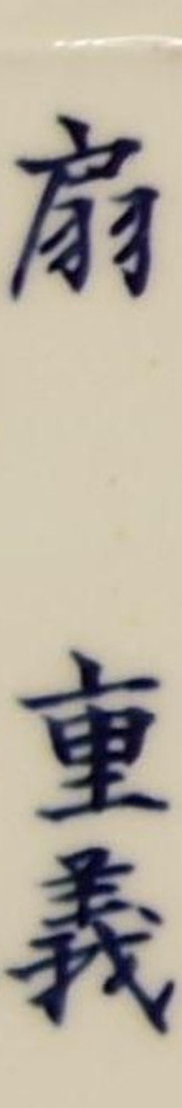扇重義
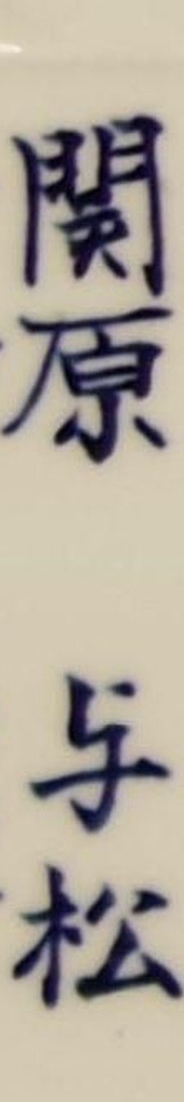関原与松
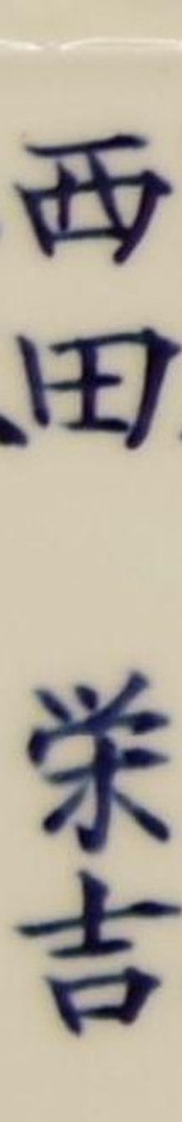西田栄吉
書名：A~D
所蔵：koyasan kongobuji
